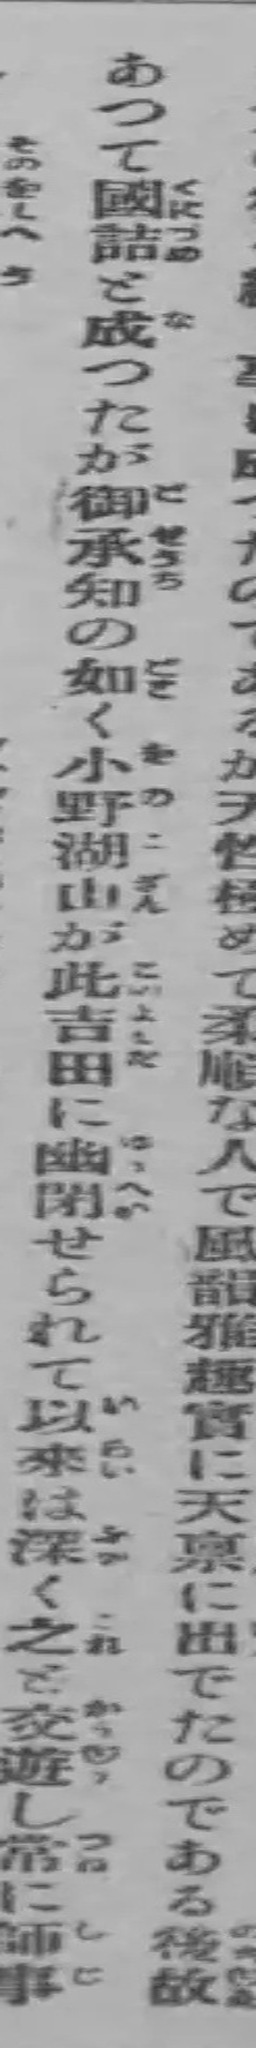あつて国詰と成つたが御承知の如く小野湖山が此吉田に幽閉せられて以来は深く之と交遊し常に師事
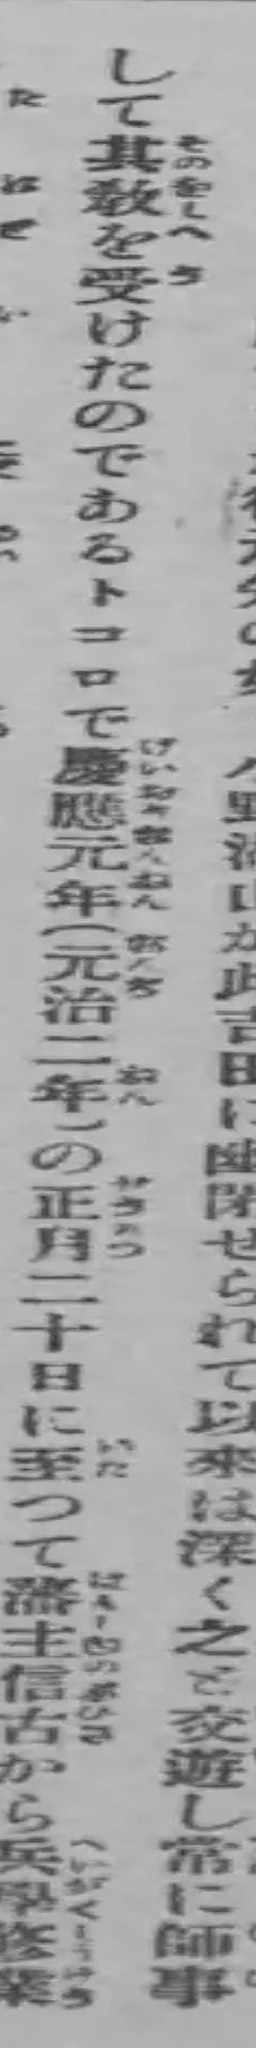して其教を受けたのであるトコロで慶応元年(元治二年)の正月二十日に至つて藩主信古から兵学修業
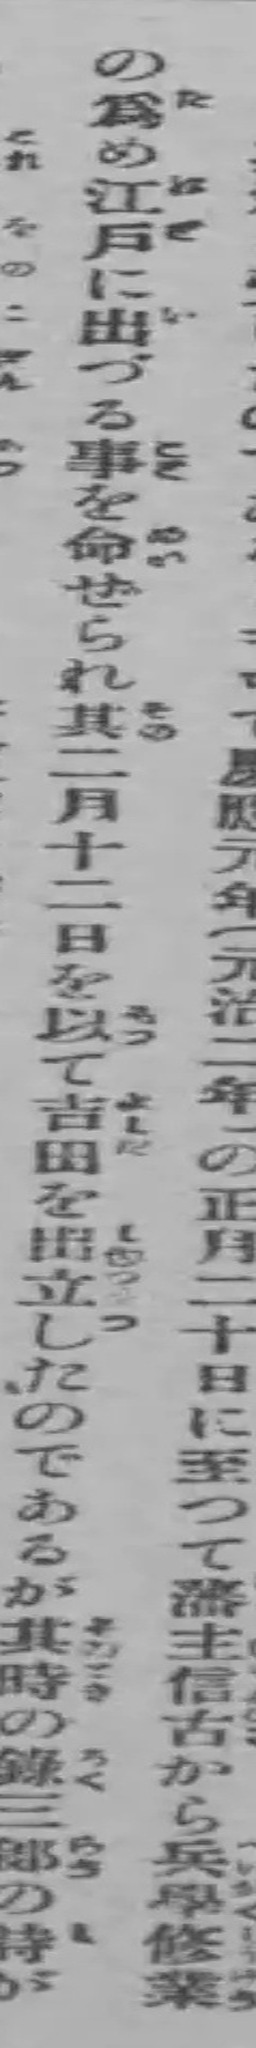の為め江戸に出づる事を命ぜられ其二月十二日を以て吉田を出立したのであるが其時の録三郎の詩が
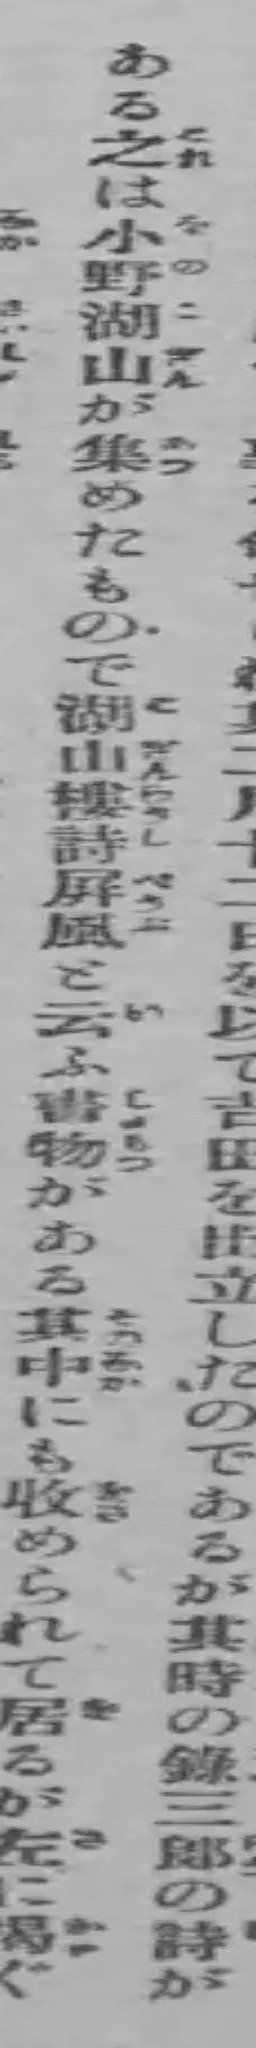ある之は小野湖山が集めたもので湖山楼詩屏風と云ふ書物がある其中にも収められて居るが左に掲ぐ
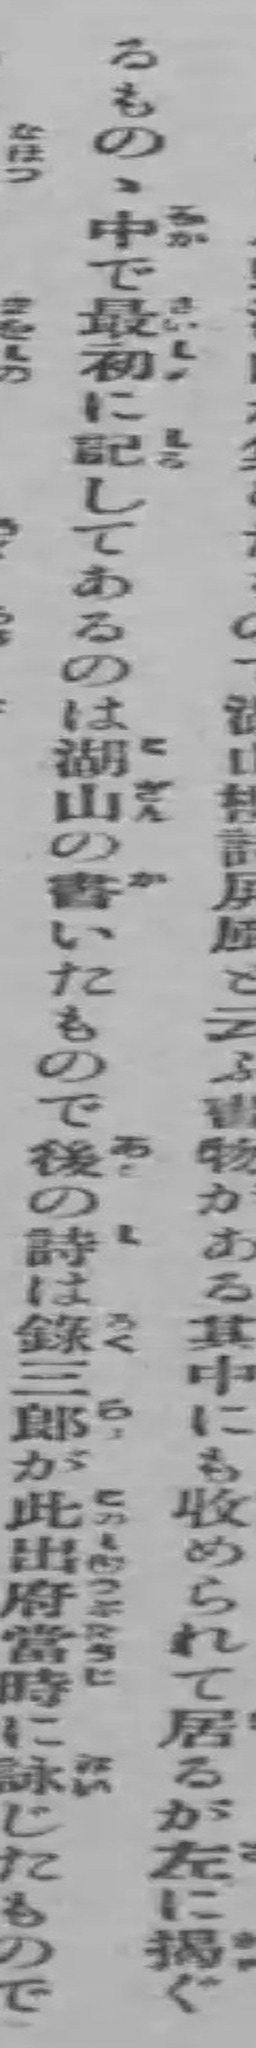るものゝ中で最初に記してあるのは湖山の書いたもので後の詩は録三郎が此出府当時に詠じたもので
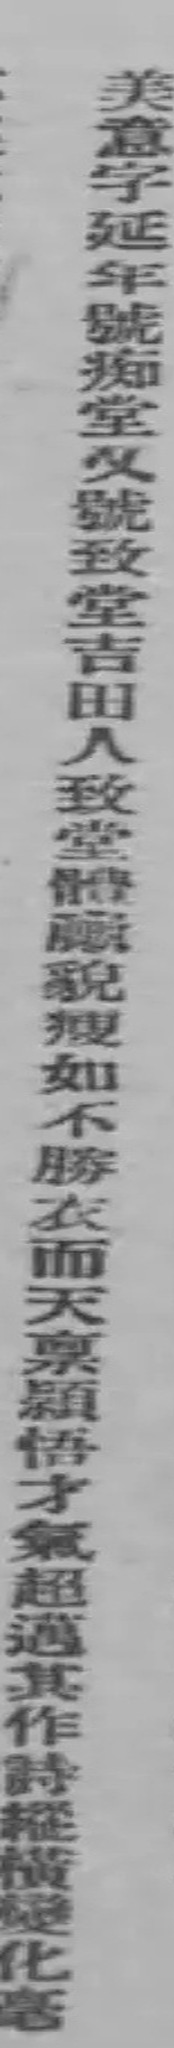美意字延年号痴堂又号致堂吉田人致堂軆貌痩如不勝衣而天稟頴悟才気超邁其作詩縦横変化毫
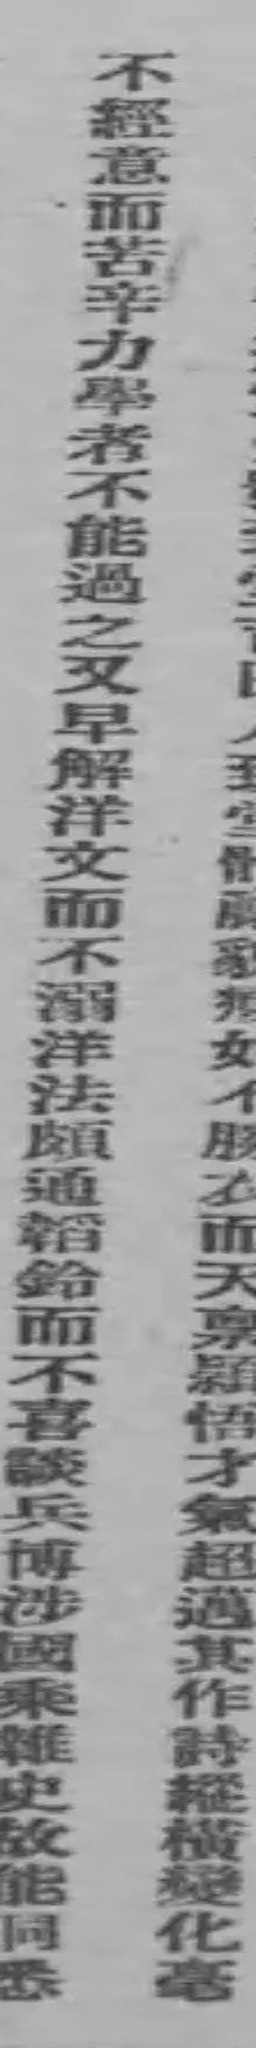不経意而苦辛力学者不能過之又早解洋文而不溺洋法頗通韜鈴而不喜談兵博渉国乗雑史故能洞悉
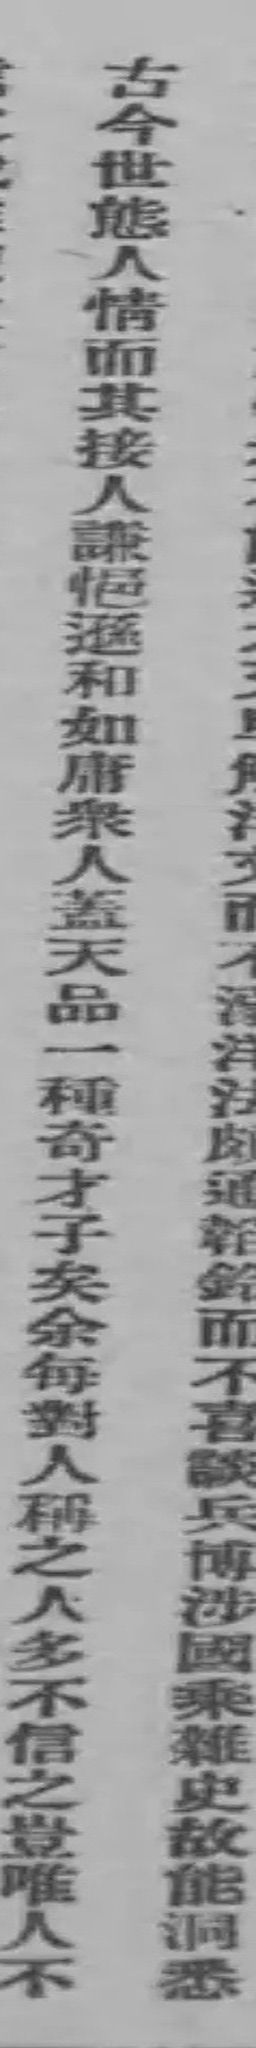古今世態人情而其接人謙悒遜和如庸衆人蓋天品一種奇才子矣余毎対人称之人多不信之豈唯人不
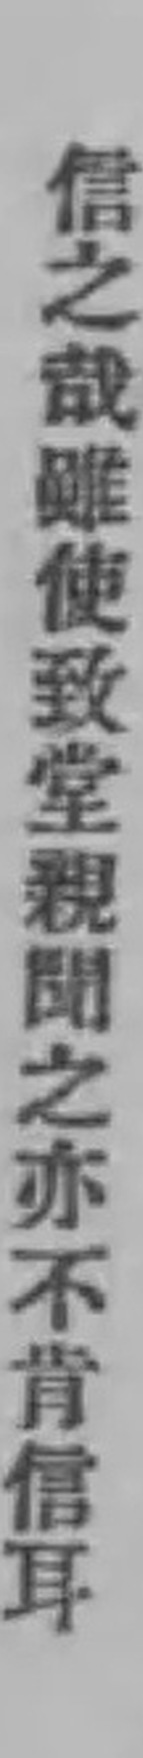信之哉雖難使致堂親聞之亦不肯信耳
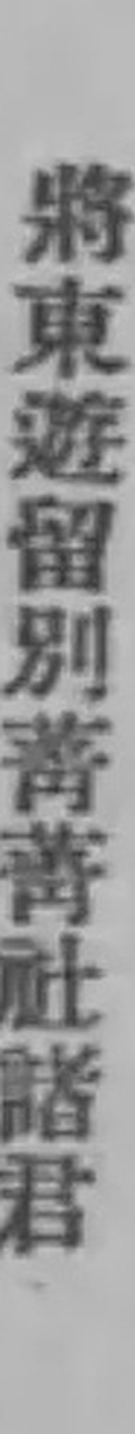将東遊留別青青社諸君
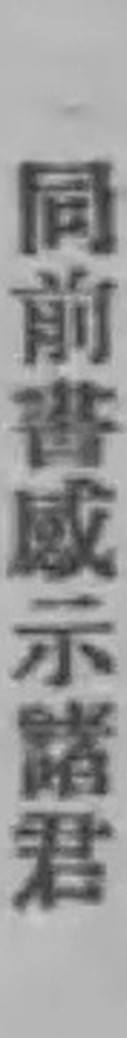同前書咸示諸君
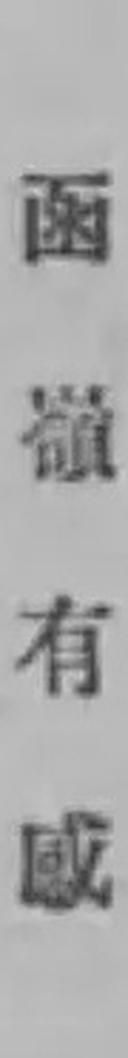函嶺有感
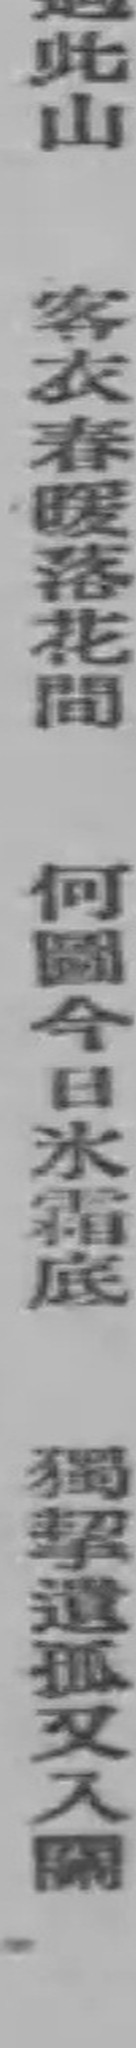曾侍阿兄過此山客衣春暖落花間何図今日氷霜底独挈遺孤又入関
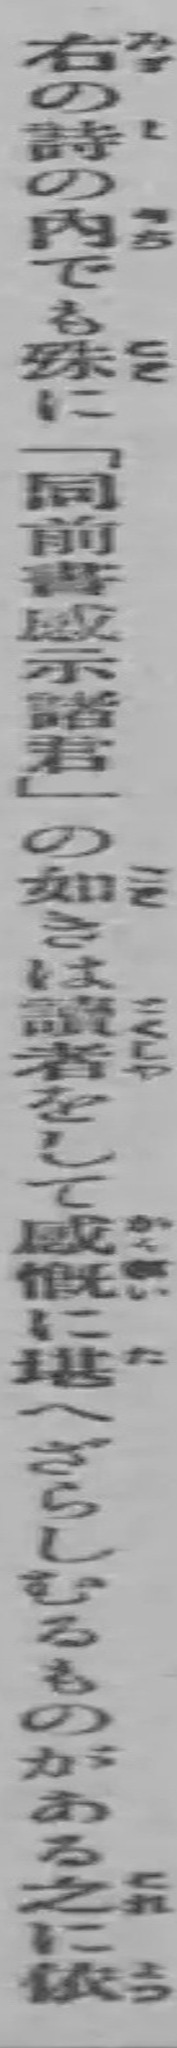右の詩の内でも殊に「同前書感示諸君」の如きは読者をして感慨に堪へざらしむるものがある之に依
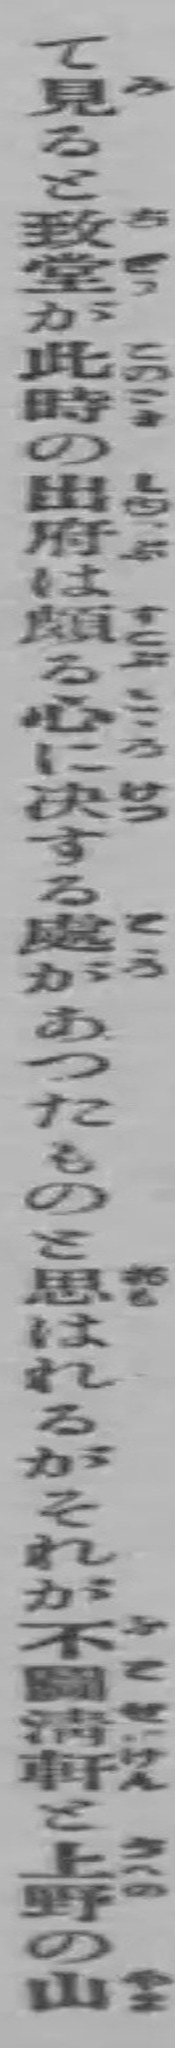て見ると致堂が此時の出府は頗る心に決する処があつたものと思はれるが不図清軒と上野の山
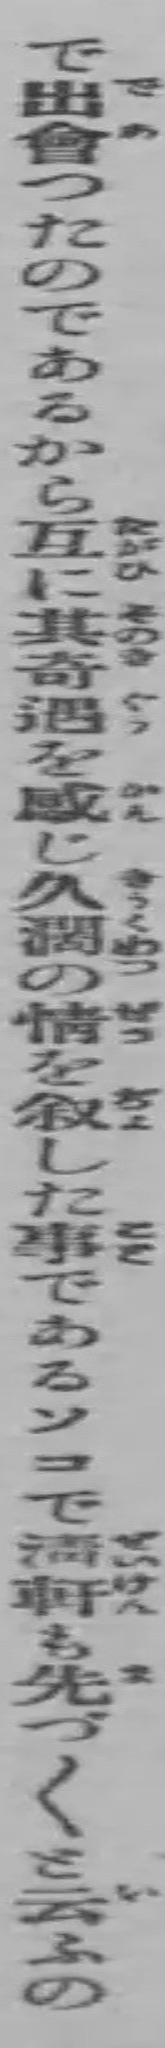で出会つたのであるから互に其奇遇を感じ久闊の情を叙した事であるソコで清軒も先づ〳〵と云ふの
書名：豊橋市史談
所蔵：国立国会図書館 National Diet Library, JAPAN
